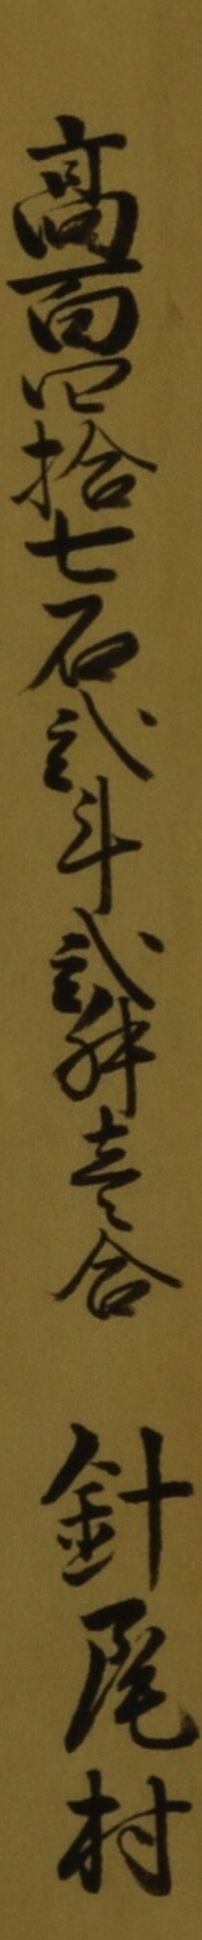一高百四拾七石弐斗弐升壱合針尾村
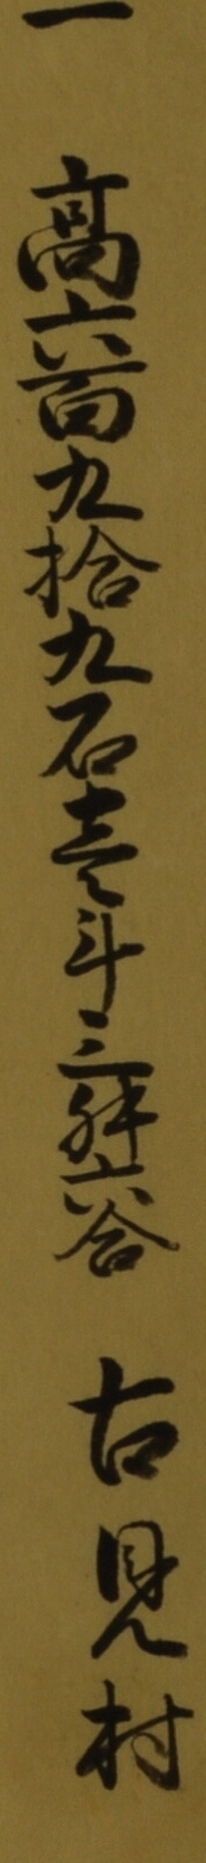一高六百九拾九石壱斗三升六合古見村
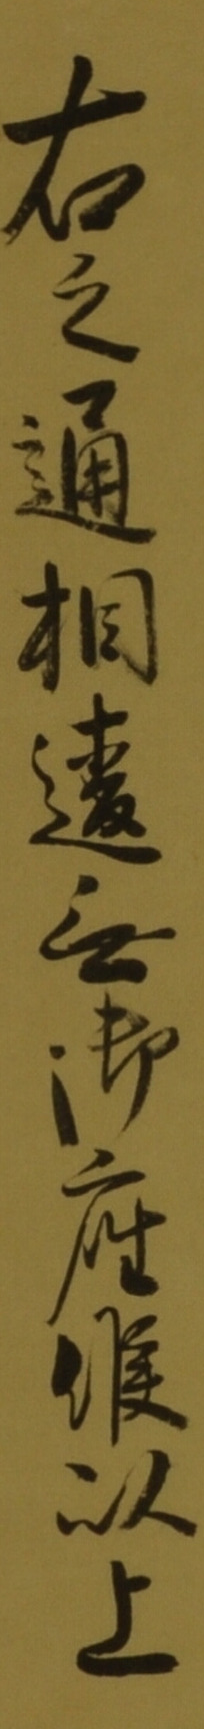右之通相違無御座候以上
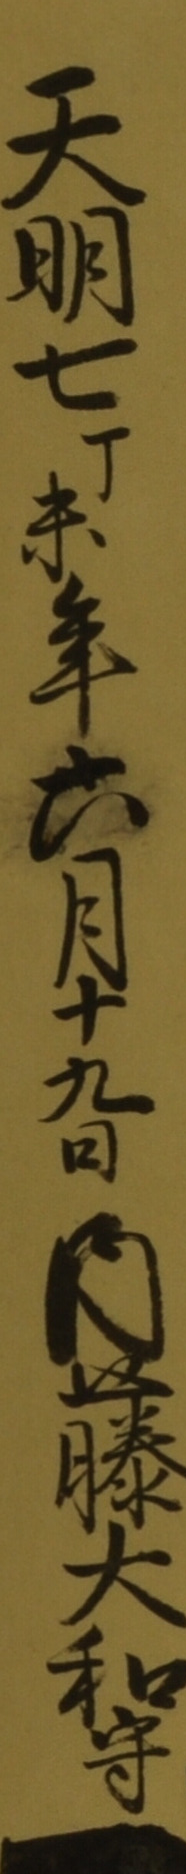天明七丁未年六月十九日内藤大和守
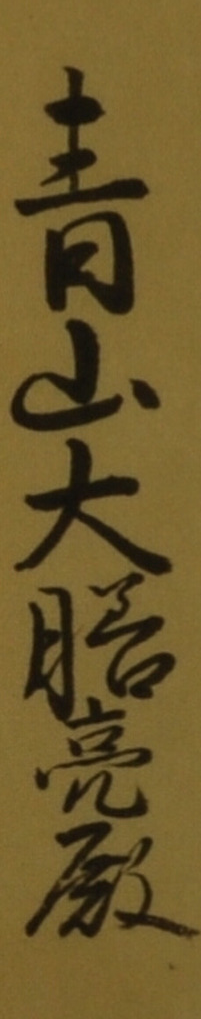青山大膳亮殿
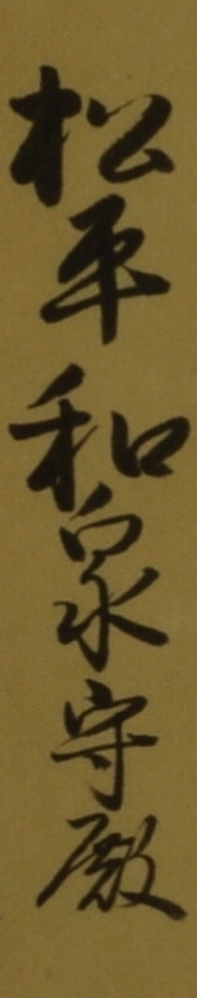松平和泉守殿

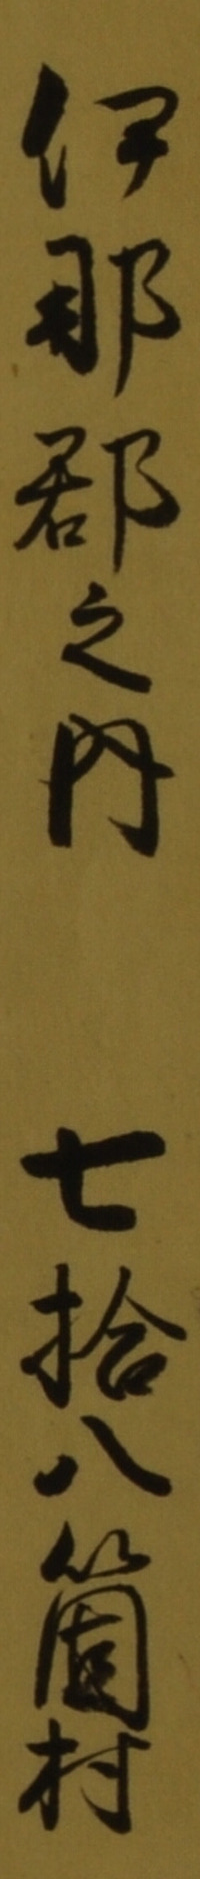伊那郡之内七拾八箇村
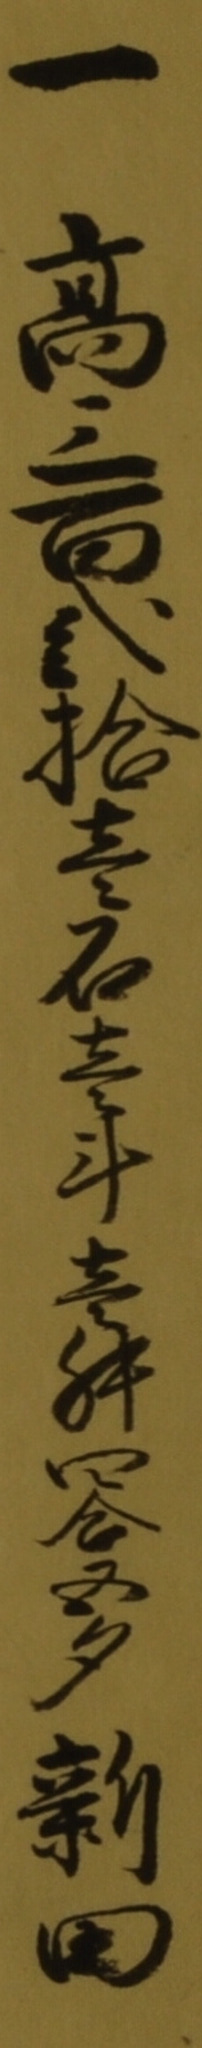一高三百弐拾壱石壱斗壱升四合五勺新田
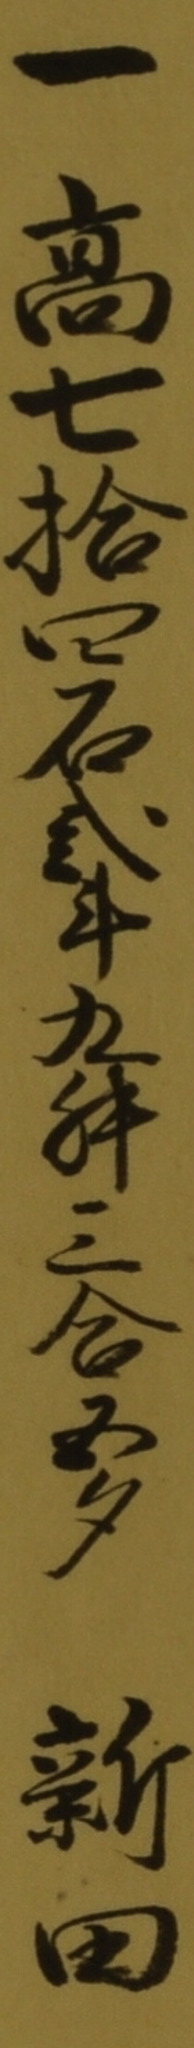一高七拾四石弐斗九升三合五勺新田
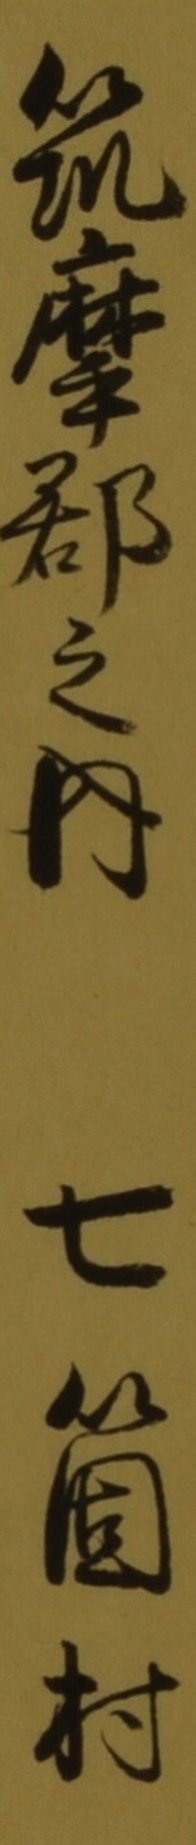筑摩郡之内七箇村
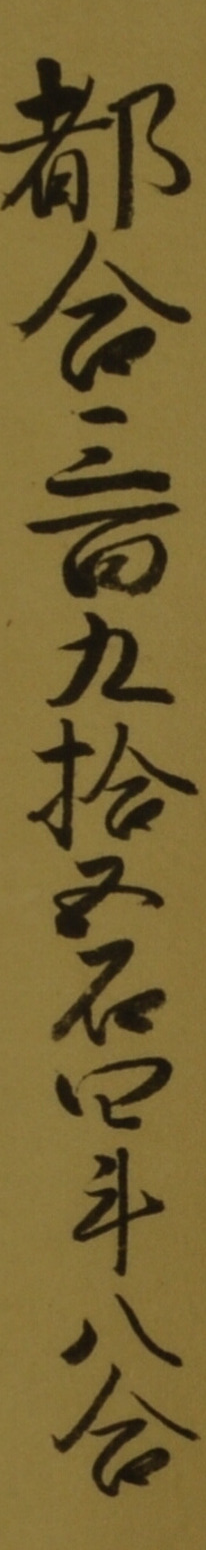都合三百九拾五石四斗八合
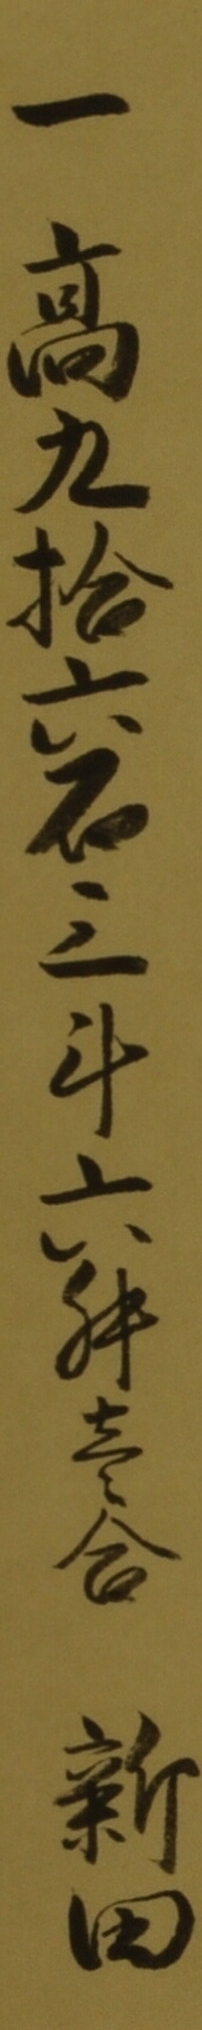一高九拾六石三斗六升壱合新田
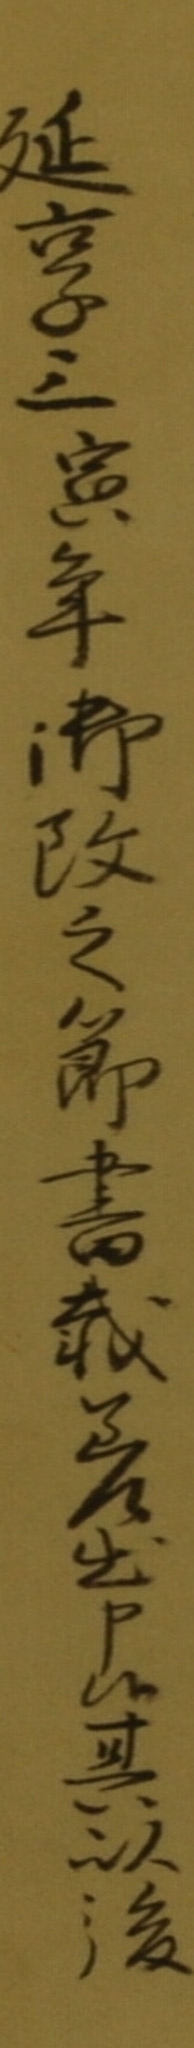延享三寅年御改之節書載差出申候其以後
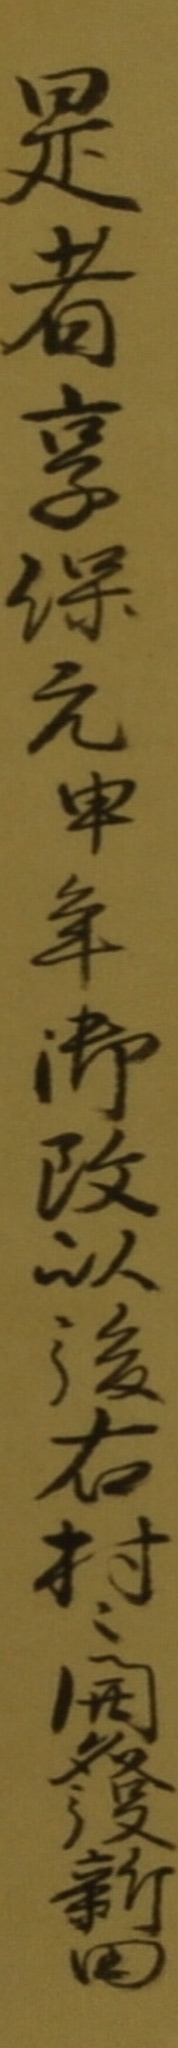是者享保元申年御改以後右村之開発新田
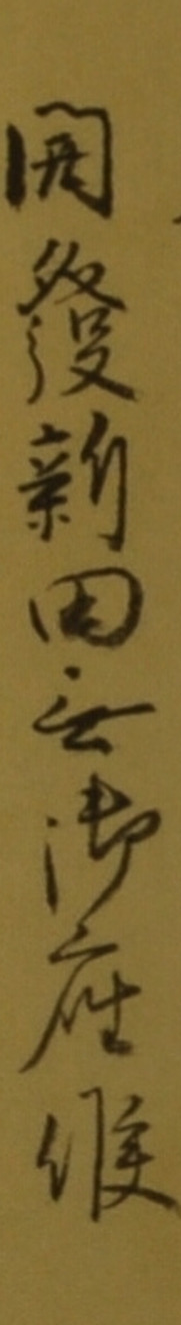開発新田無御座候
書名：信濃国伊那郡筑摩郡高遠領知郷村高辻帳
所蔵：伊那市立高遠町図書館・合同会社AMANE
